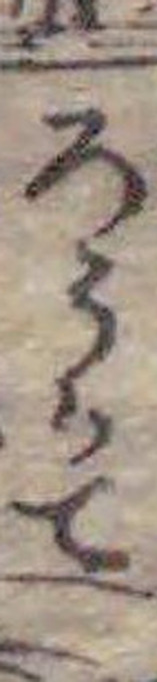ろうかて
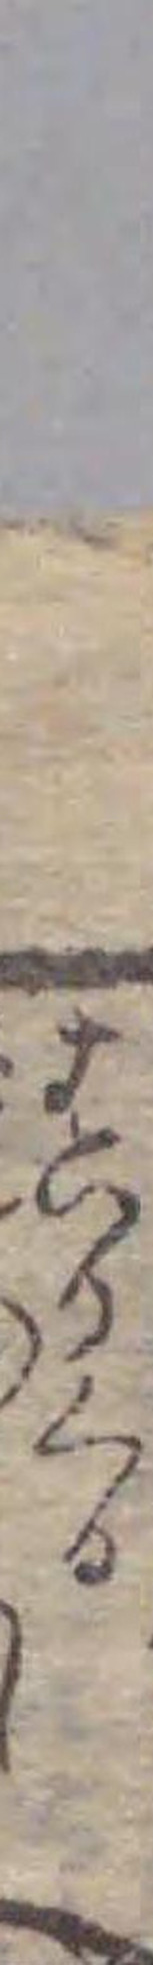はいりくる
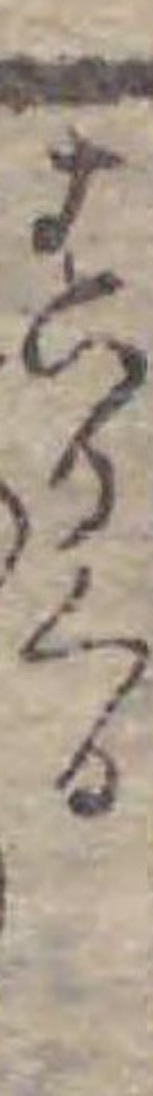はいりくる
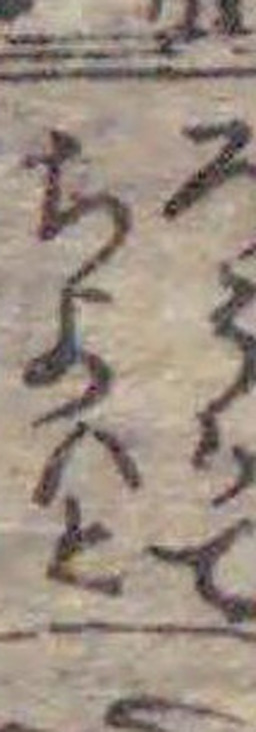ちよいと
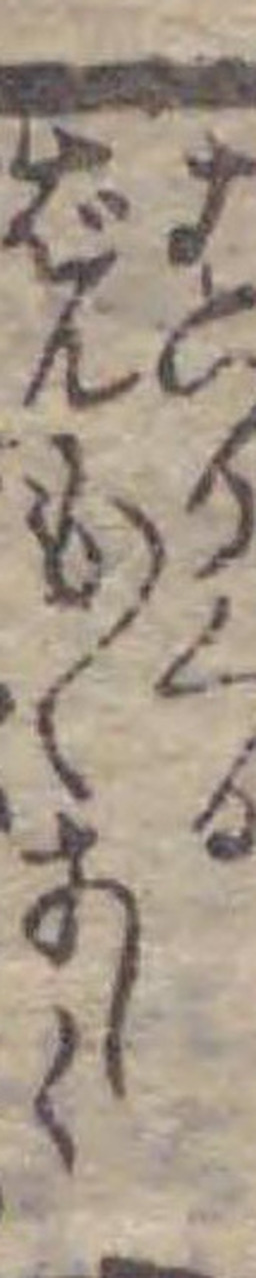ばんも〳〵あしく
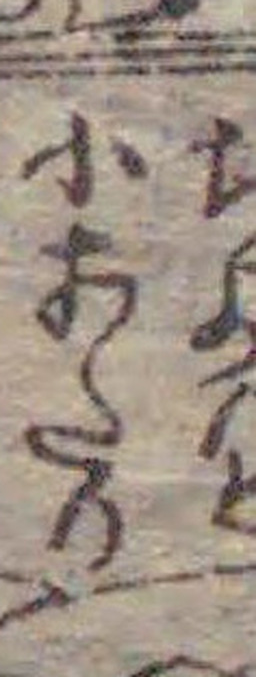小あたり
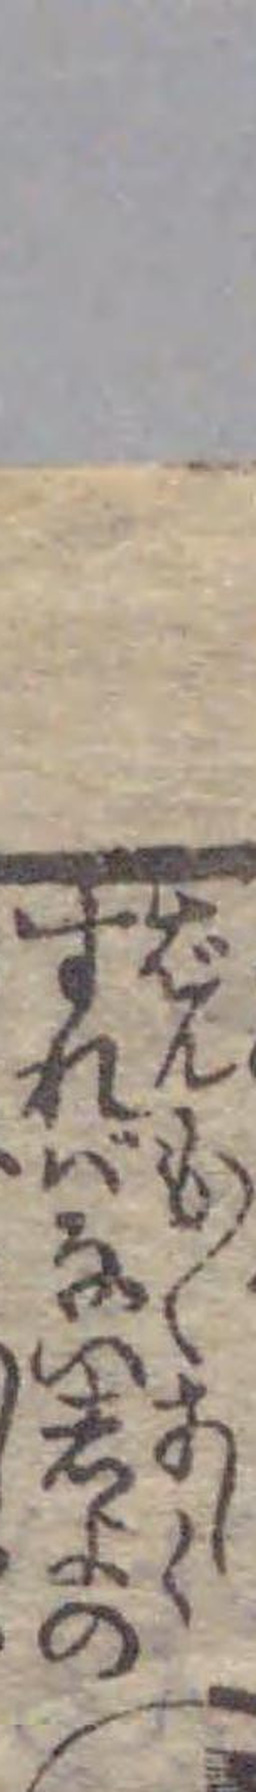すればないしよの
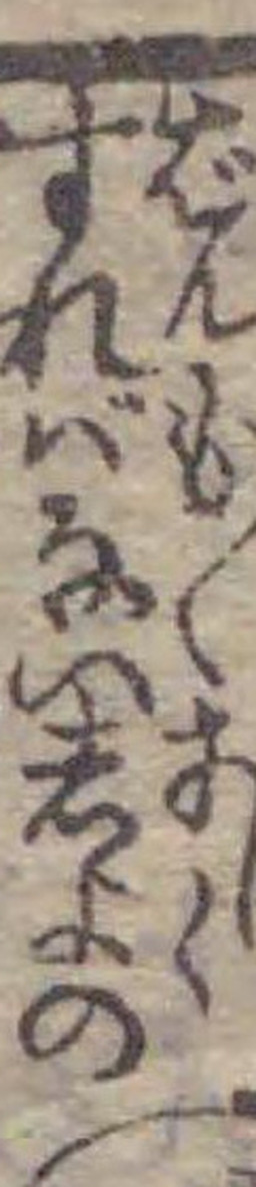すればないしよの
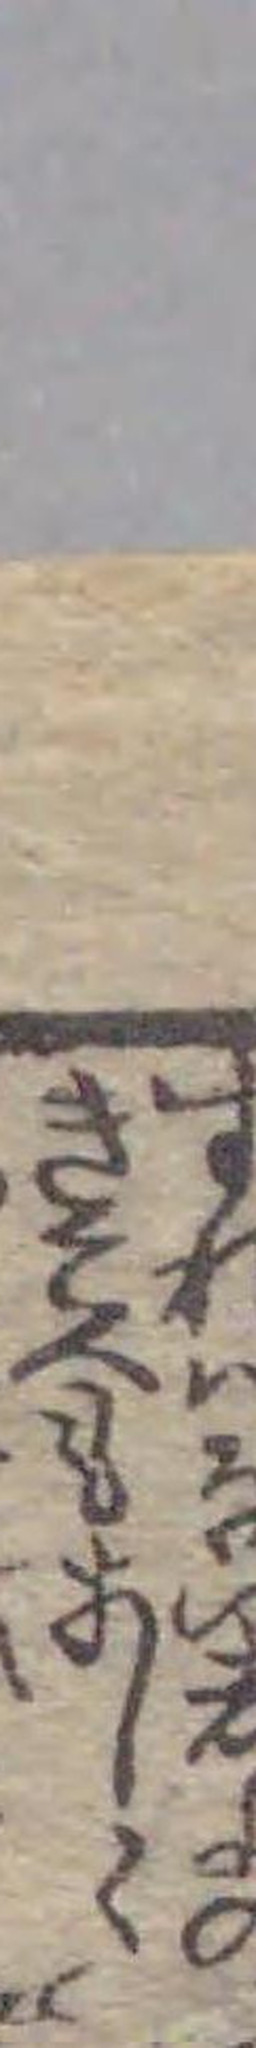きこへもあしく
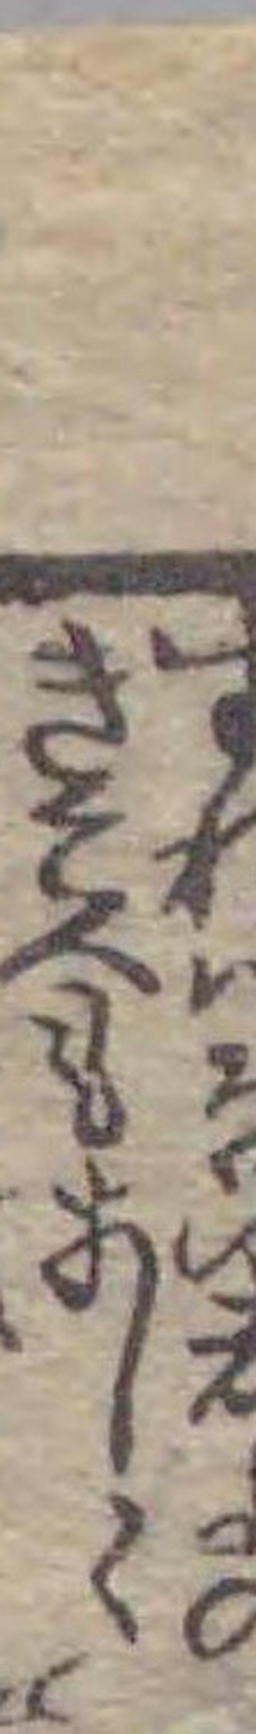きこへもあしく
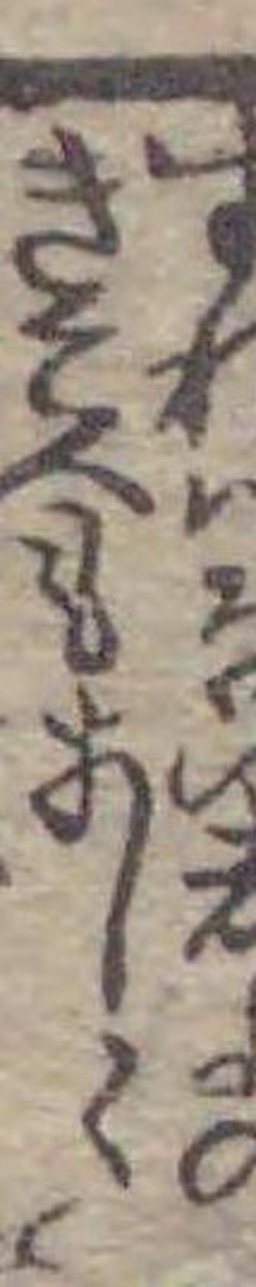きこへもあしく
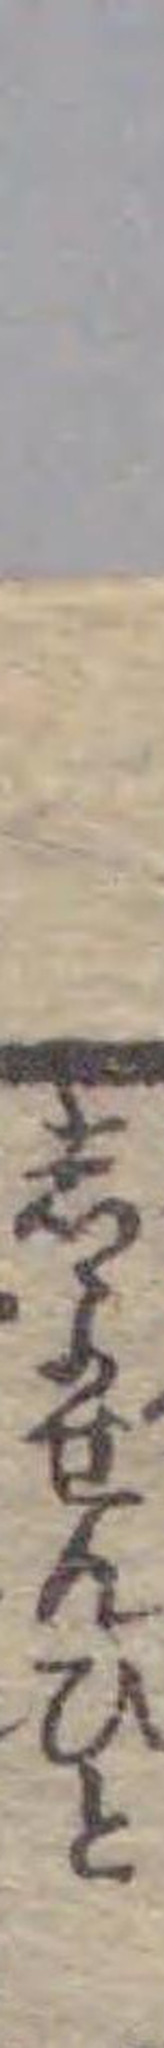しよせんひと
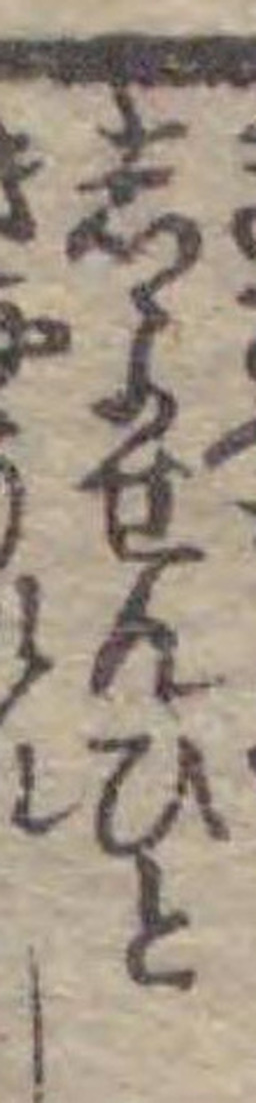しよせんひと
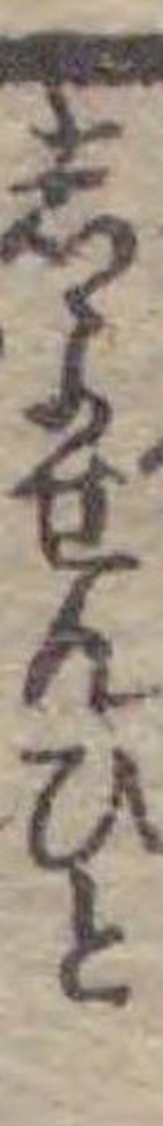しよせんひと
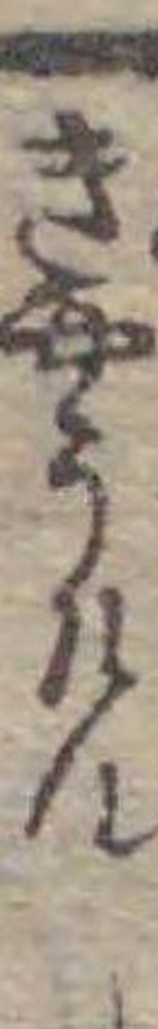きやうけん
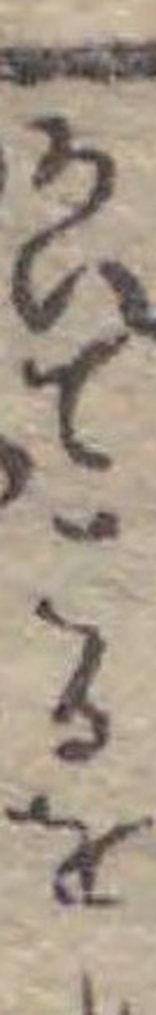かいてるを
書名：竜宮苦界玉手箱 : 3巻
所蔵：国立国会図書館 National Diet Library, JAPAN
